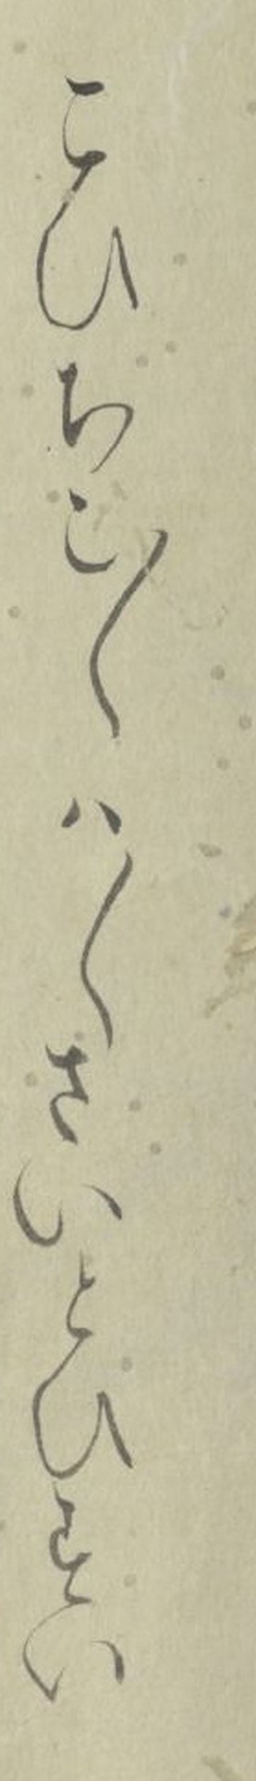こひちこ〳〵は〳〵さいとひすい
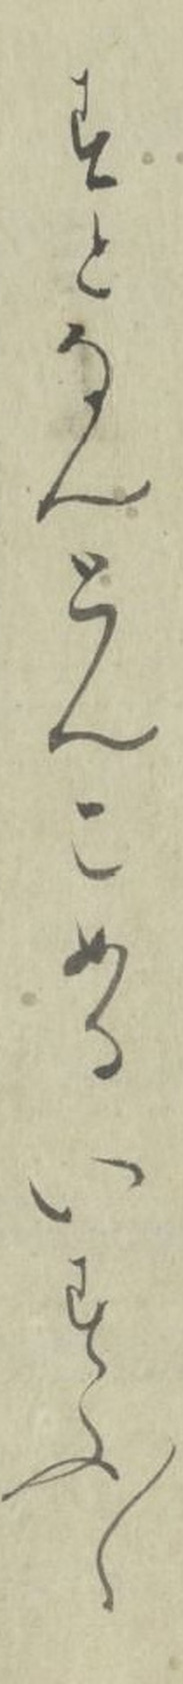すとなんとんこめるいすふ〳〵
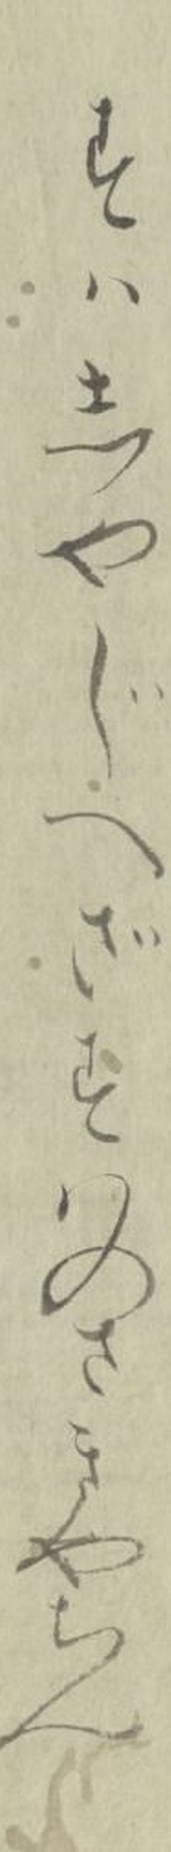すはしやじへざすはのさきやちん
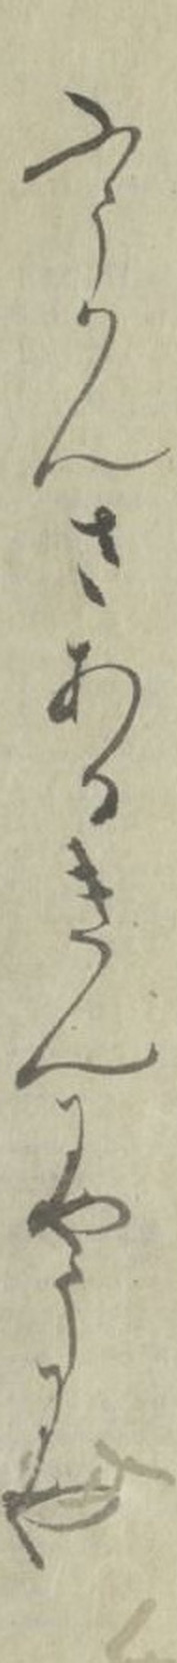ふうかんさあるきんにやうにや

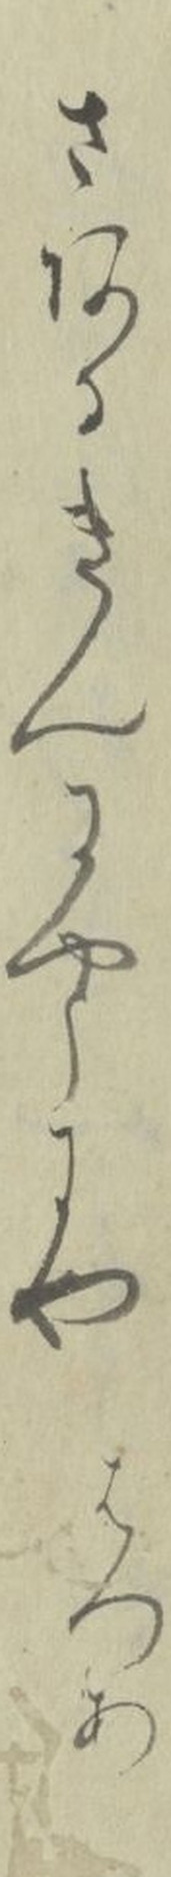さあるきんにやうにやはつあ
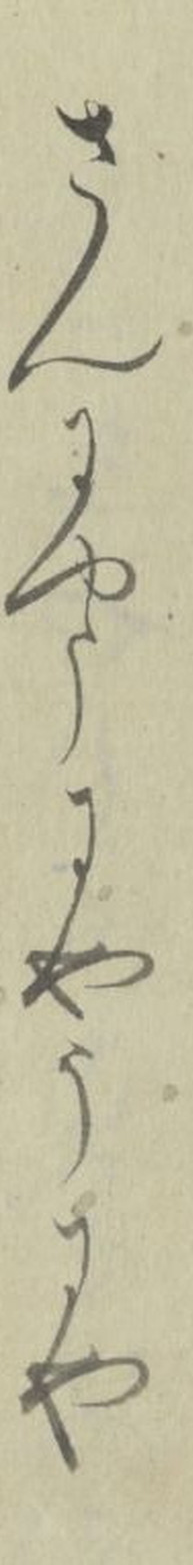さんにゆうにやうにや
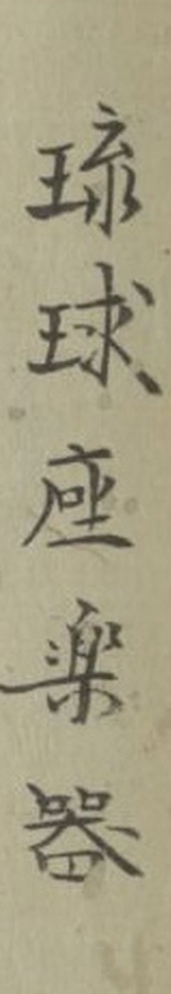琉球座楽器
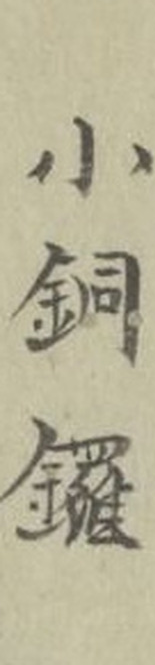小銅鑼

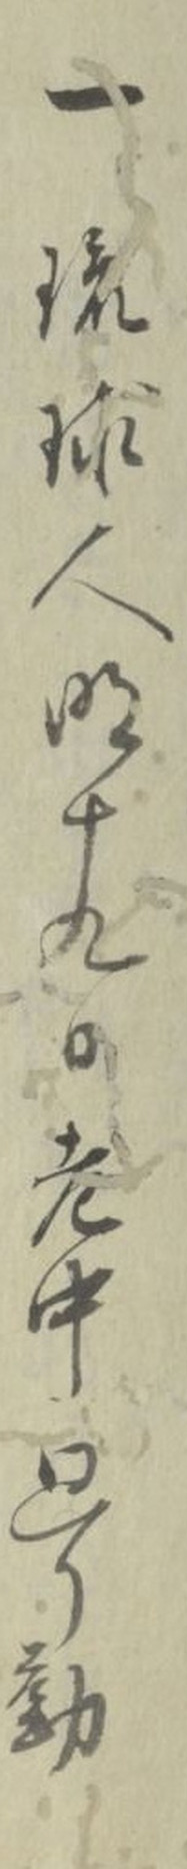一琉球人明十九日老中廻り勤
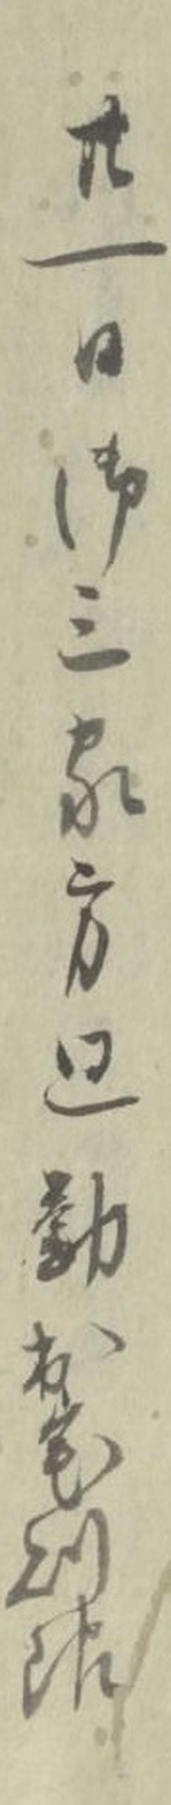廿一日御三家方廻勤出宅刻限
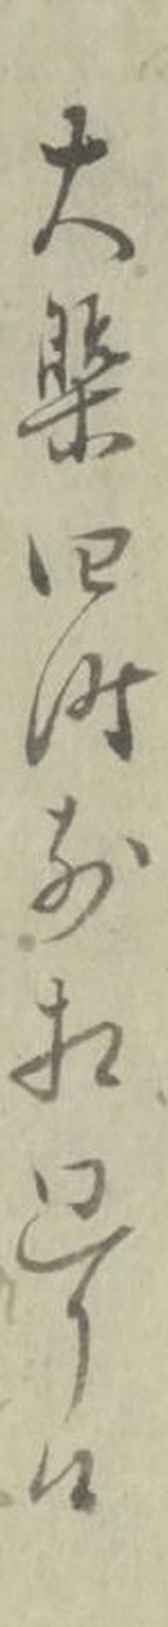大概四時前相廻り候
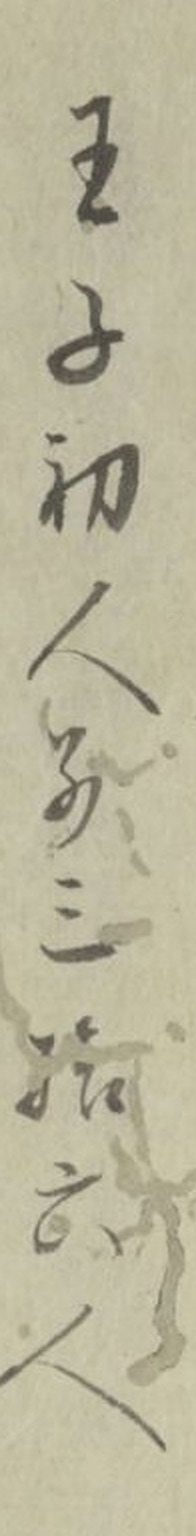王子初人別三拾六人
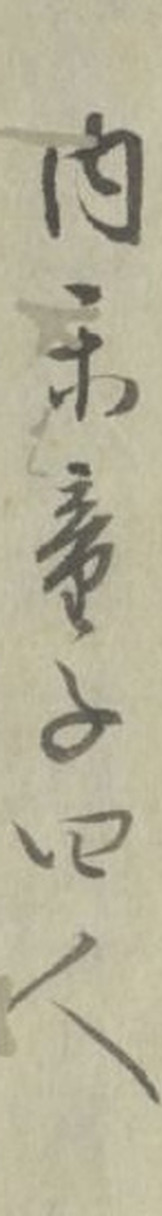内楽童子四人

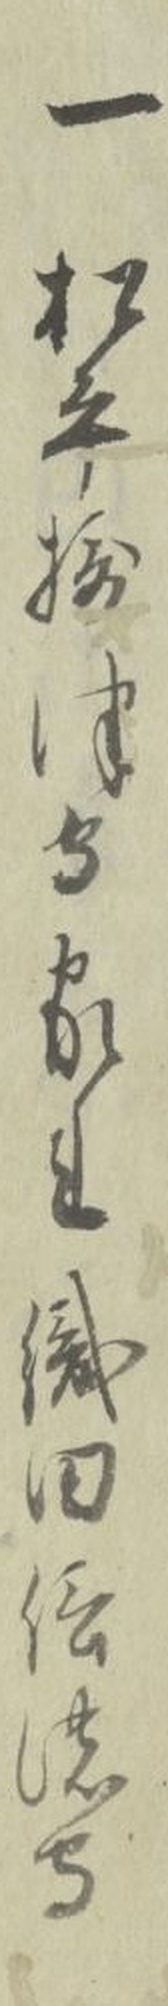一松平摂津守家来織田信濃守
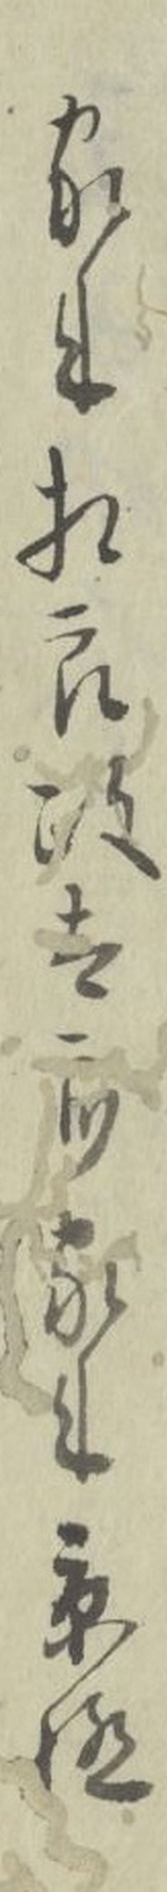家来相良政太郎家来京極
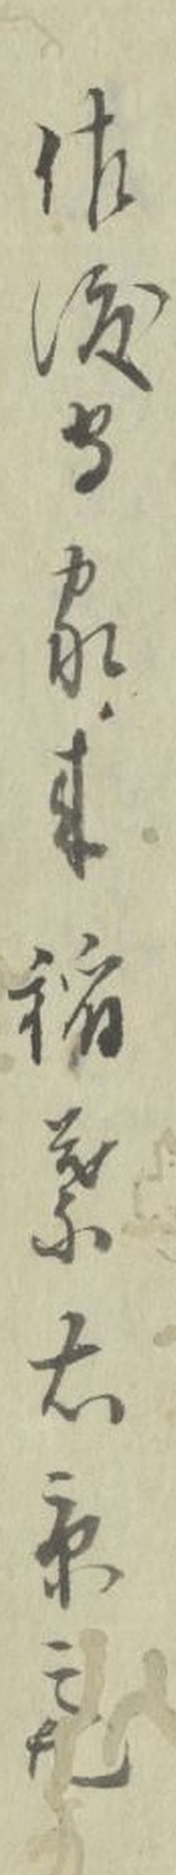佐渡守家来稲葉右京亮
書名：琉球来朝記 自八至十四終
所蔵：University of the Ryukyus Library
